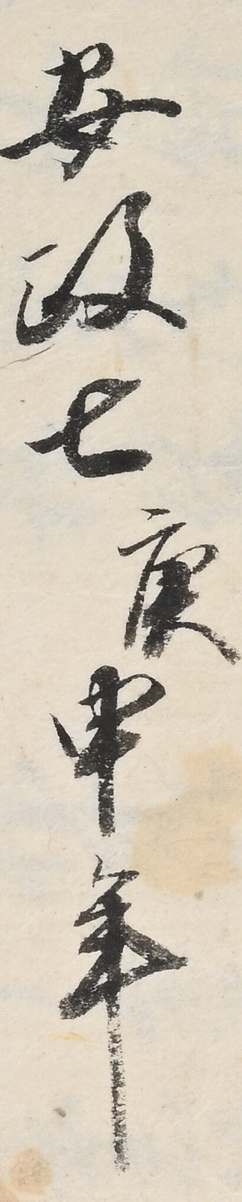安政七庚申年
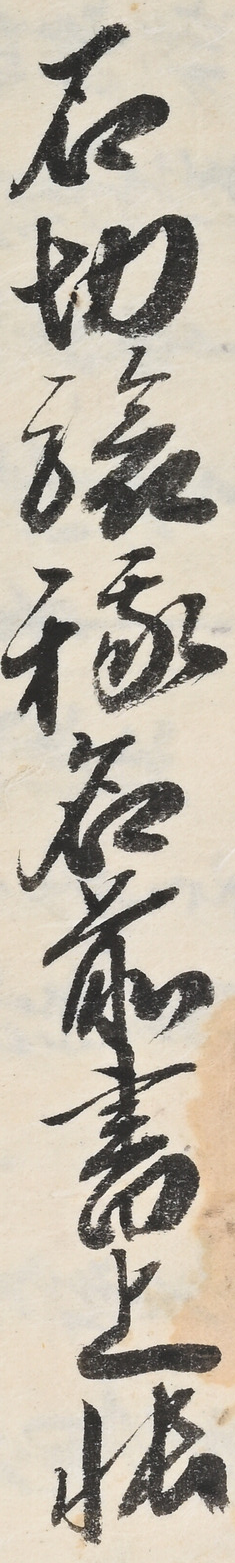石切旅稼名前書上帳
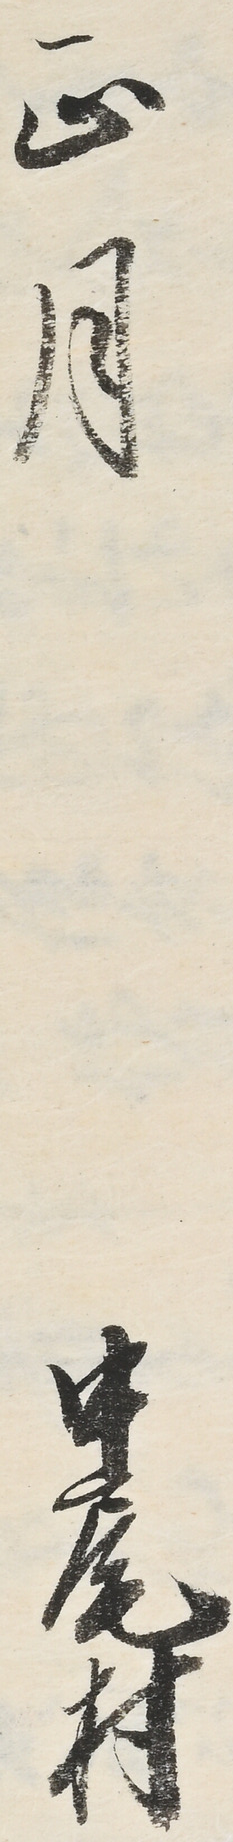正月中尾村

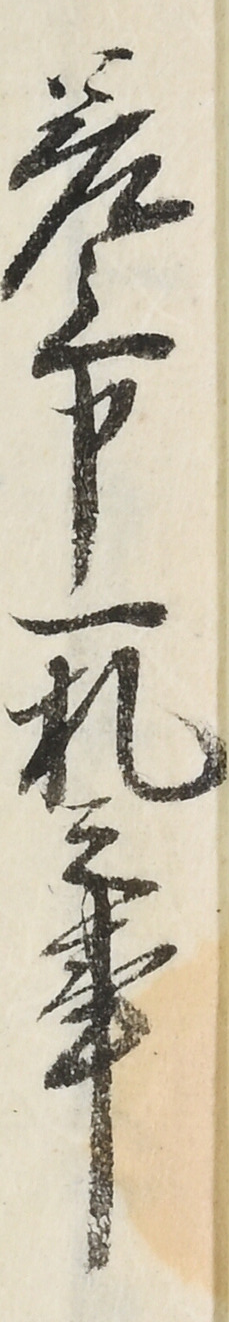差上申一札之事
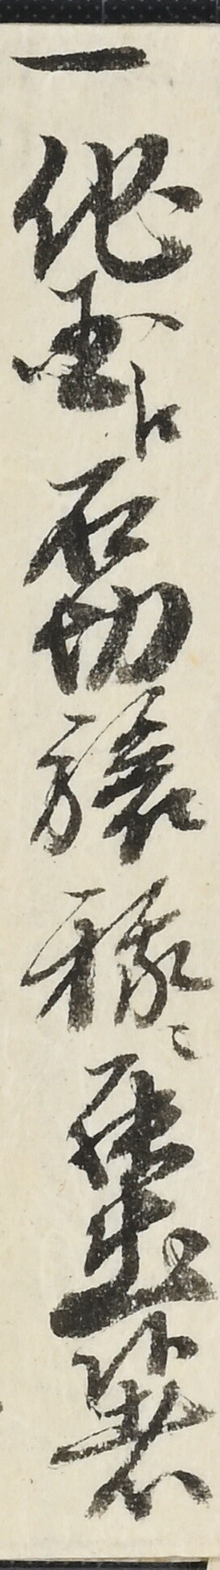一他国え石切旅稼ニ罷出候者
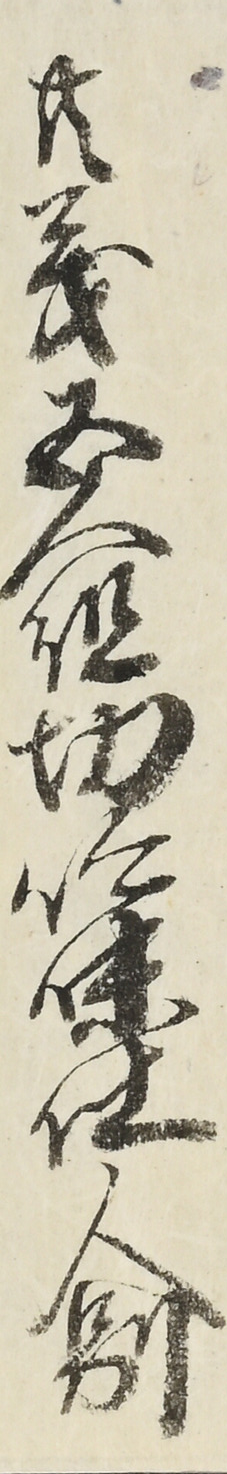共義五人組切吟味仕人別
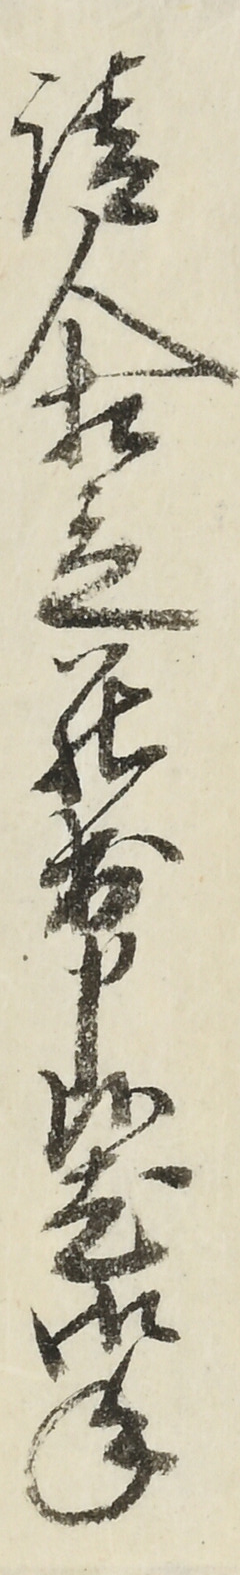請人払立罷出申候尤御年
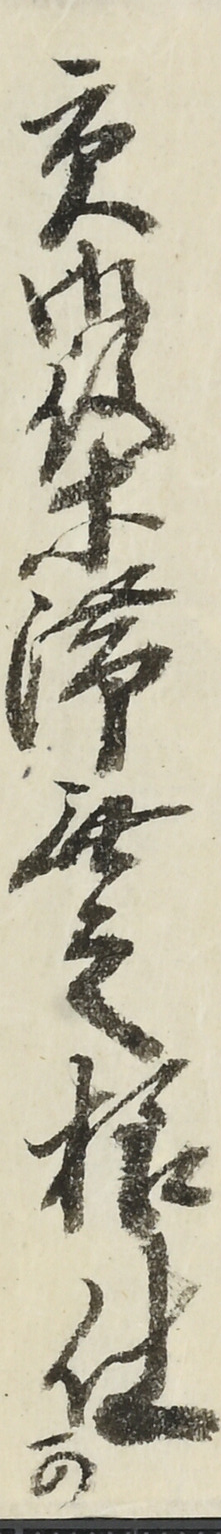貢御役米滞無之様仕可
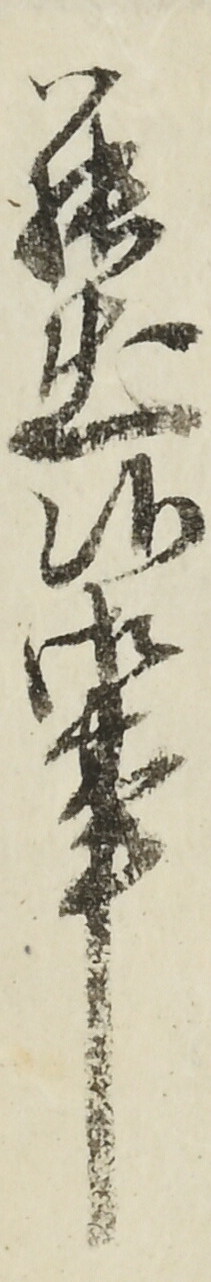罷出候御事
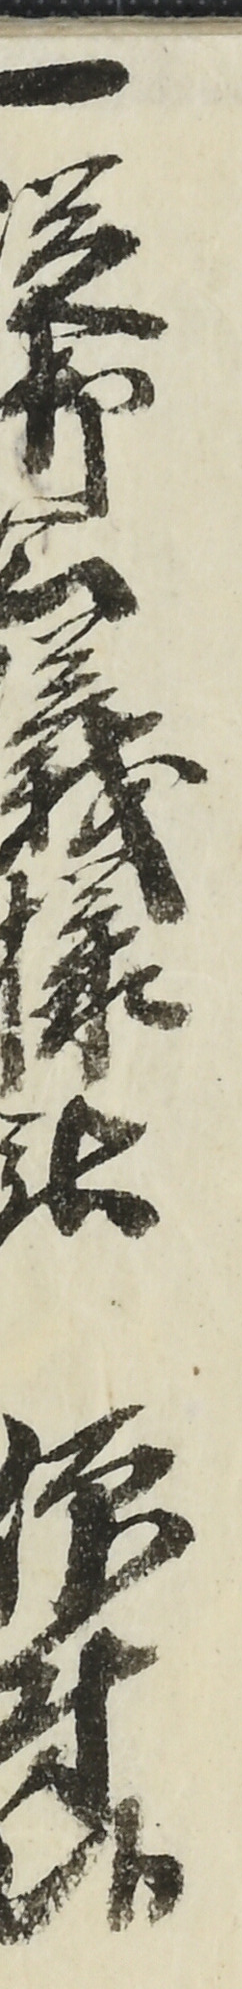一従御公儀様被仰付候

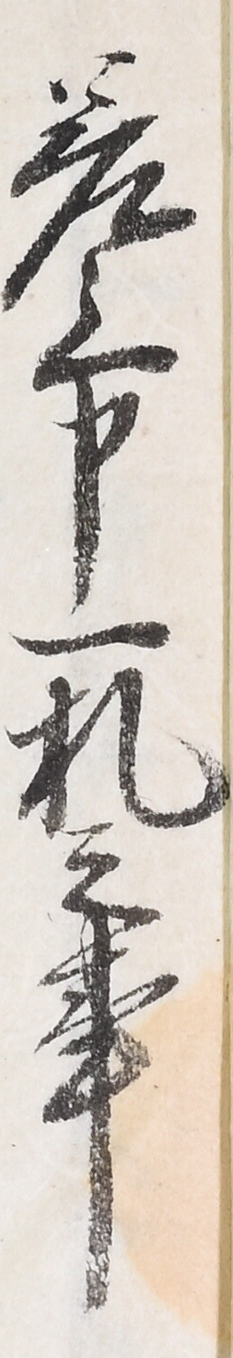差上申一札之事
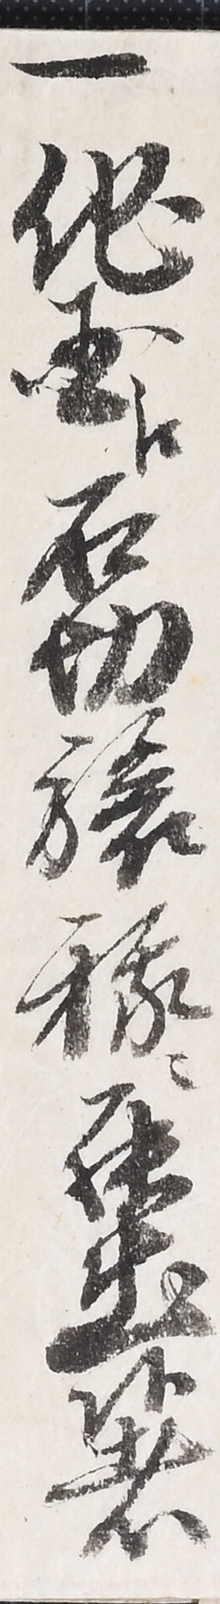一他国江石切旅稼ニ罷出候者
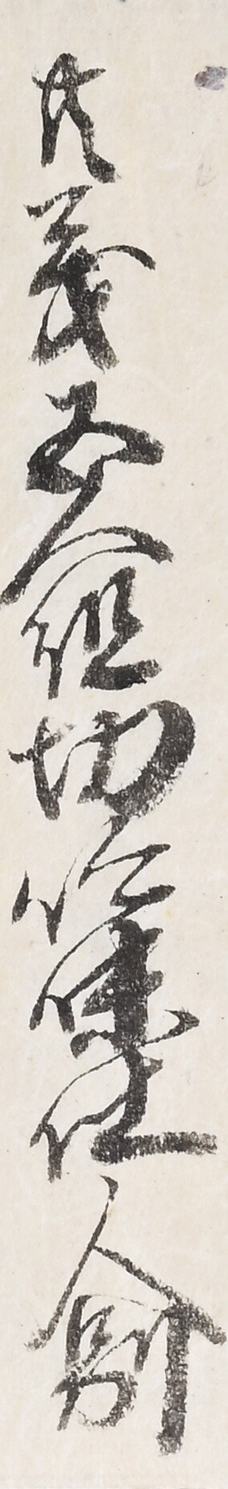共義五人組切吟味仕人別
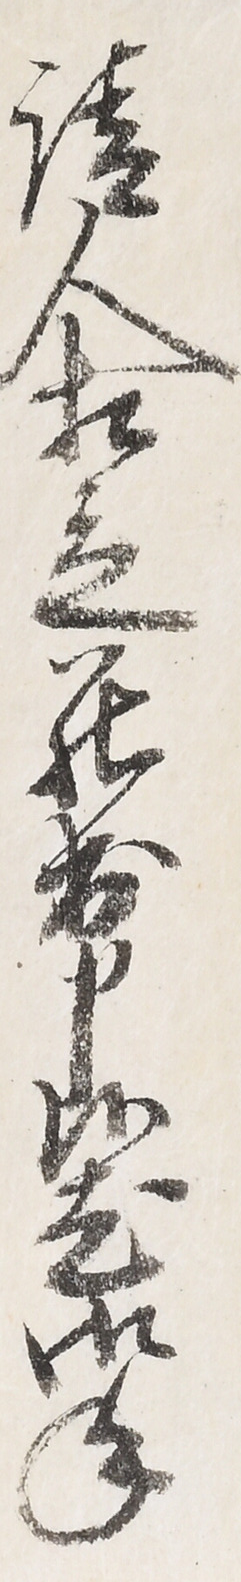請人相立罷出申候尤御年
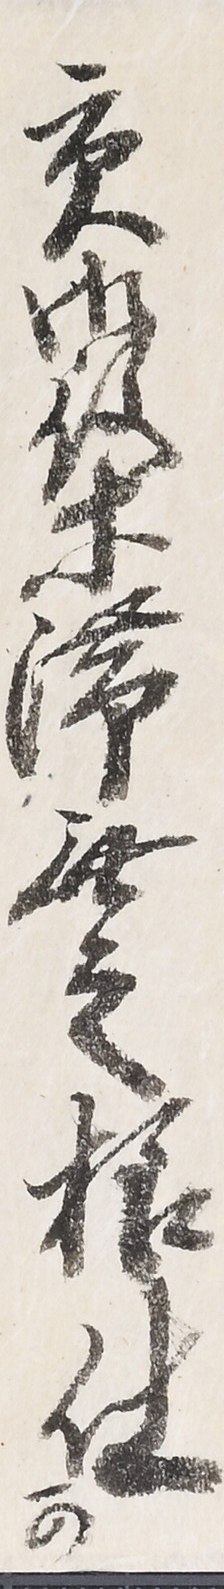貢御役等滞無之様仕可
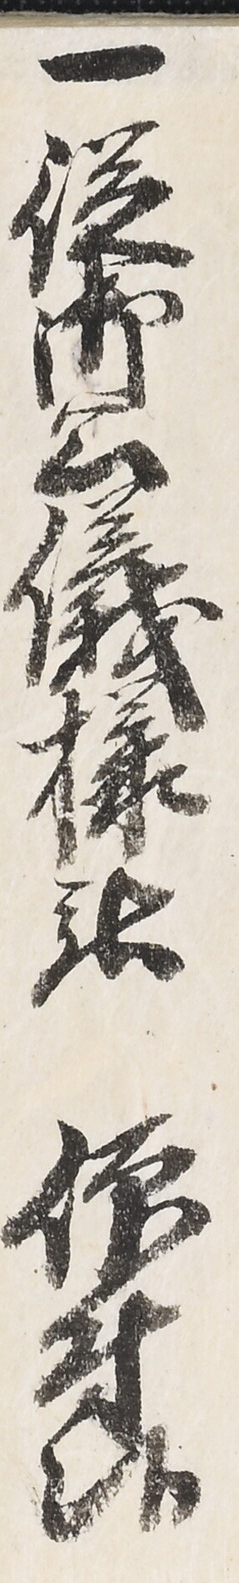一従御公儀様被仰付候
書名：安政七庚申年正月石切旅稼名前書上帳
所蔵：伊那市立高遠町図書館・合同会社AMANE
